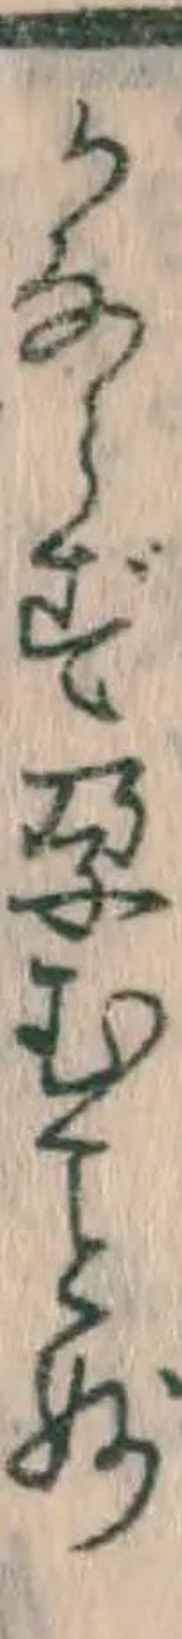かならず孕むこと妙
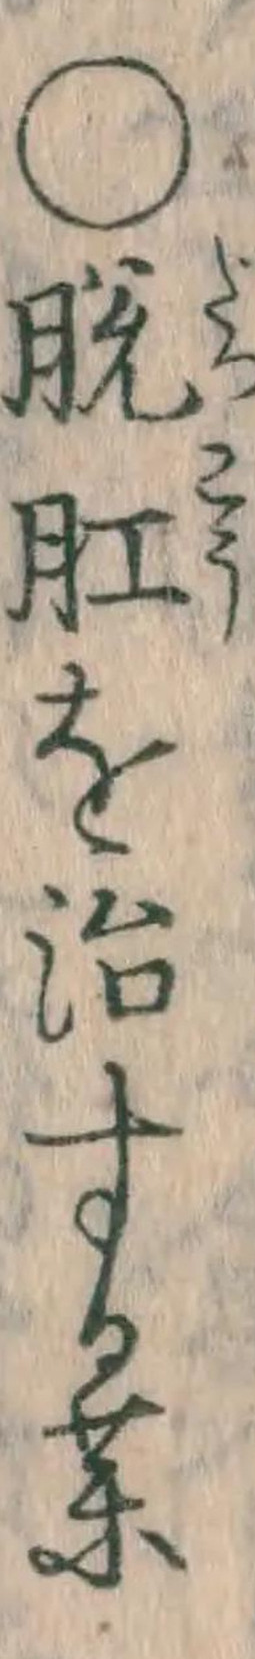○脱肛を治する薬
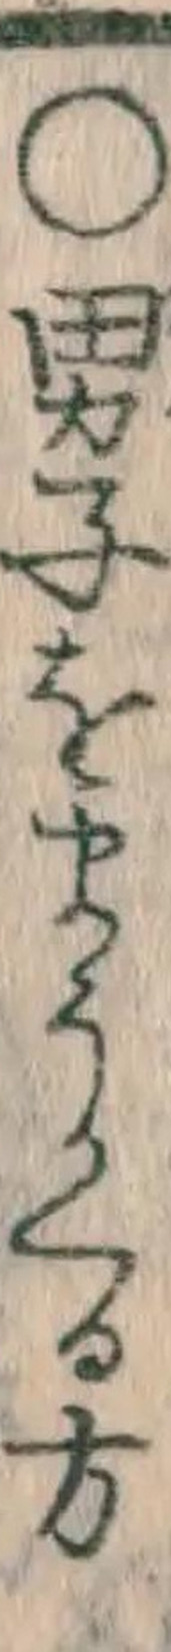○男子をまうくる方
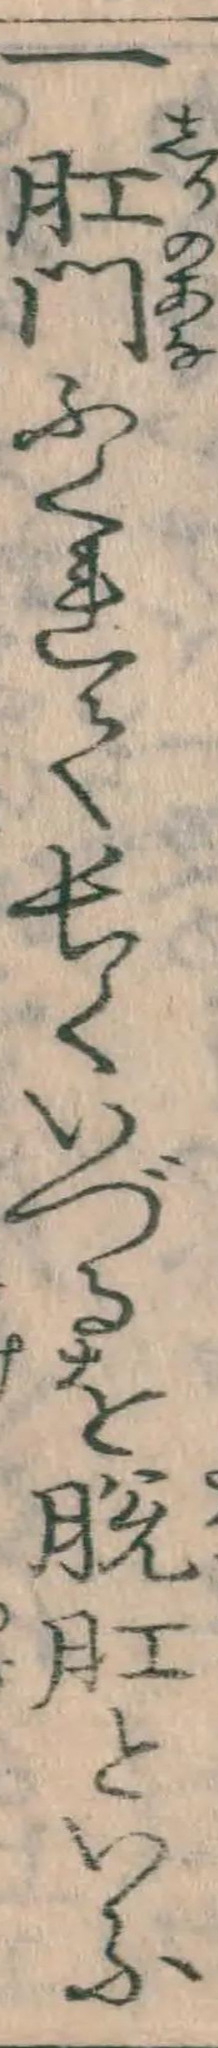一肛門ふくれて長くいづるを脱肛といふ
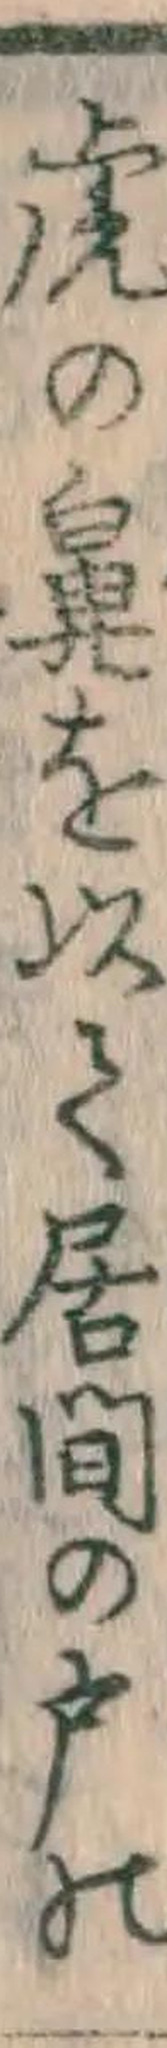虎の鼻を以て居間の戸の
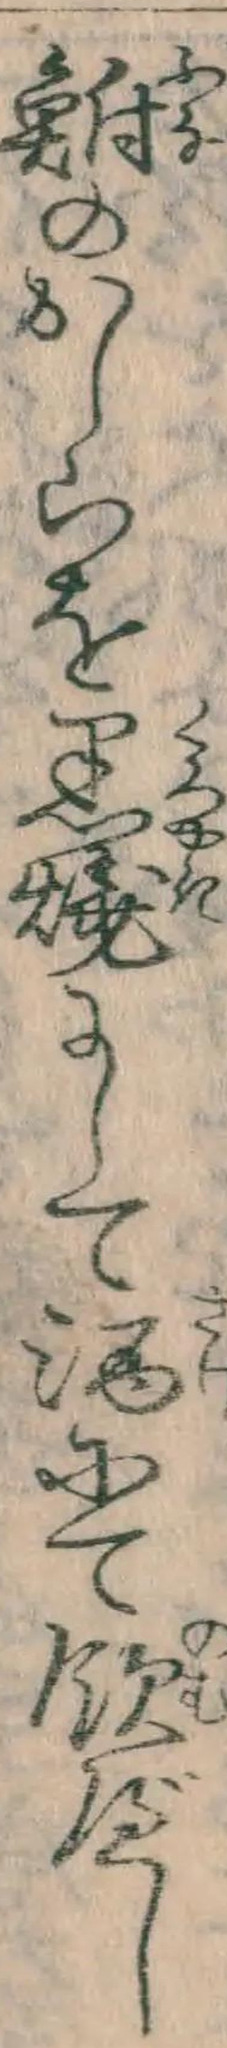鮒のかしらを黒焼にして酒にて飲べし
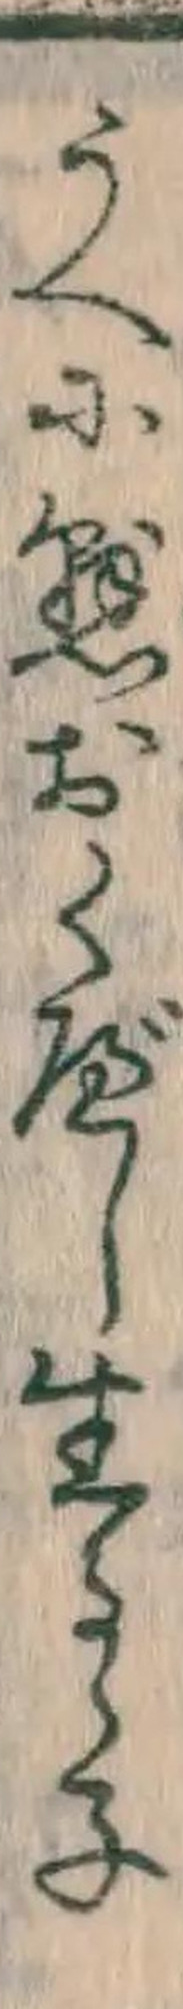うへに懸おくべし生るゝ子
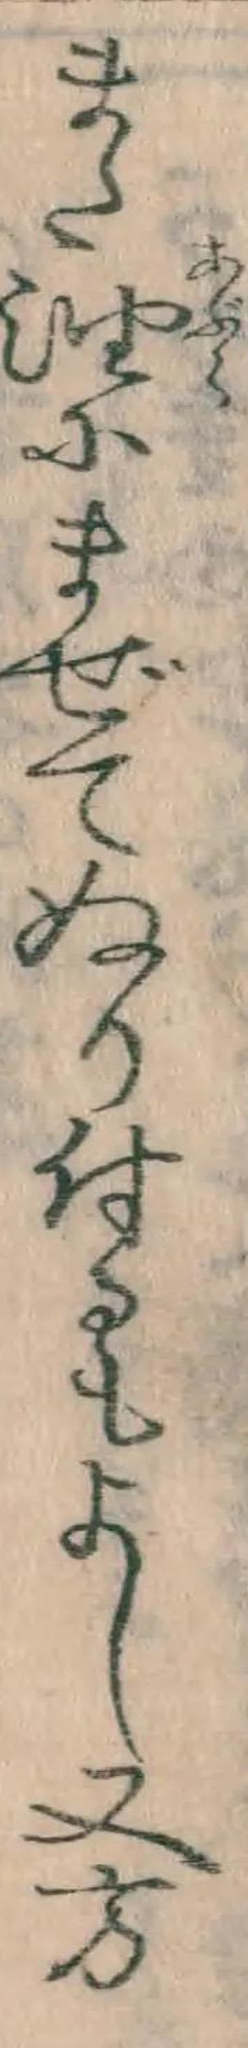また油にまぜてぬり付るもよし又方
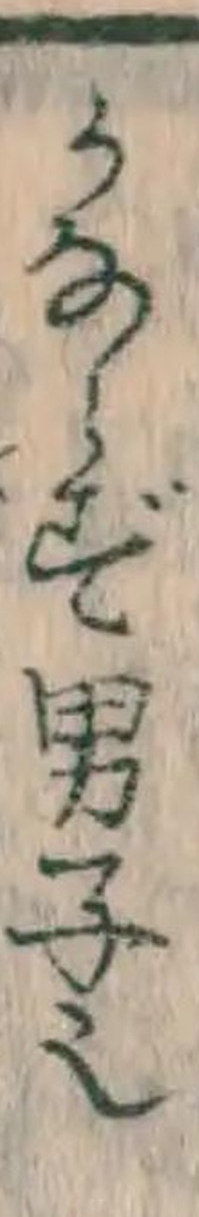かならず男子也
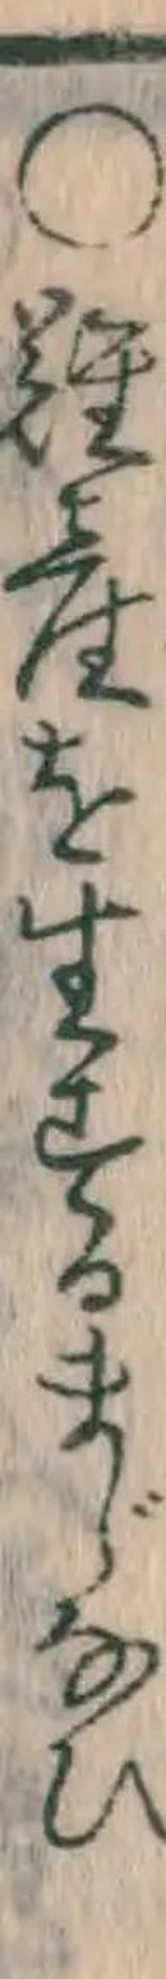○難産を生するまじなひ
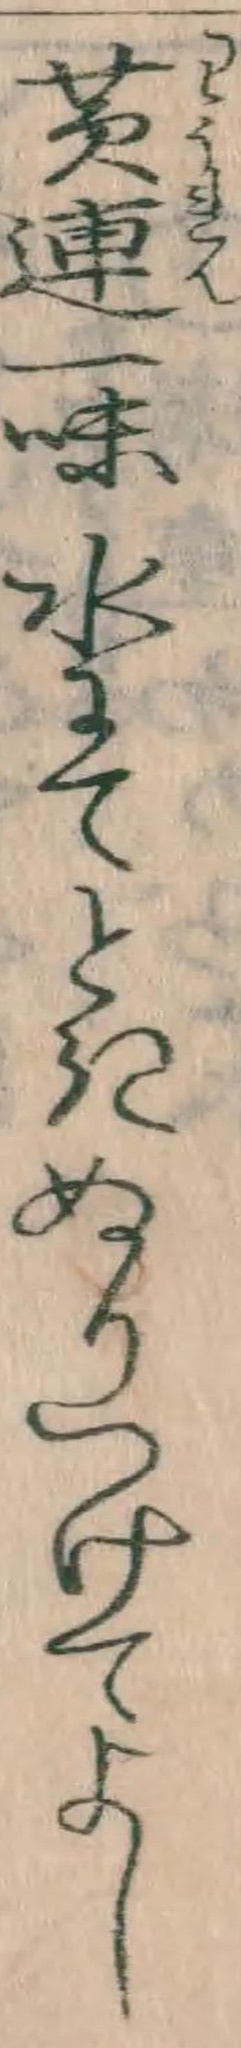黄連一味水にてときぬりつけてよし
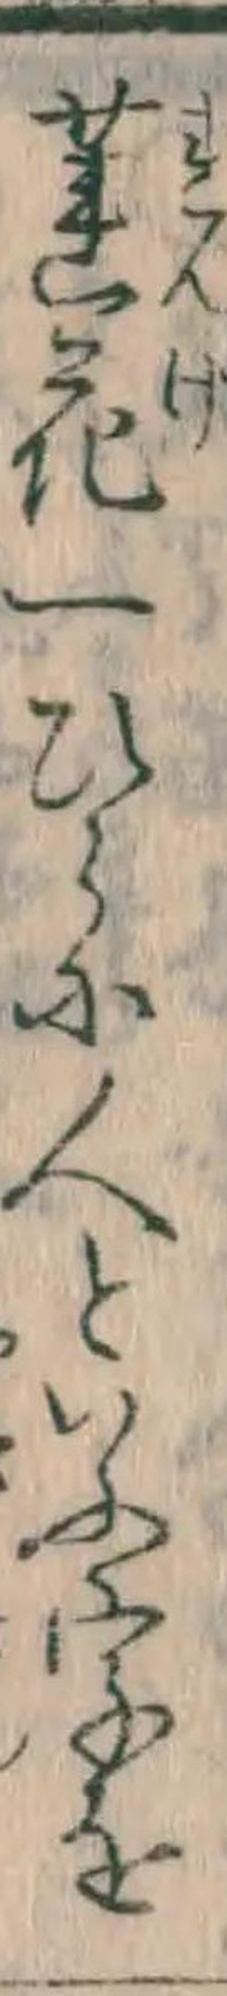蓮花一ひらに人といふ字を
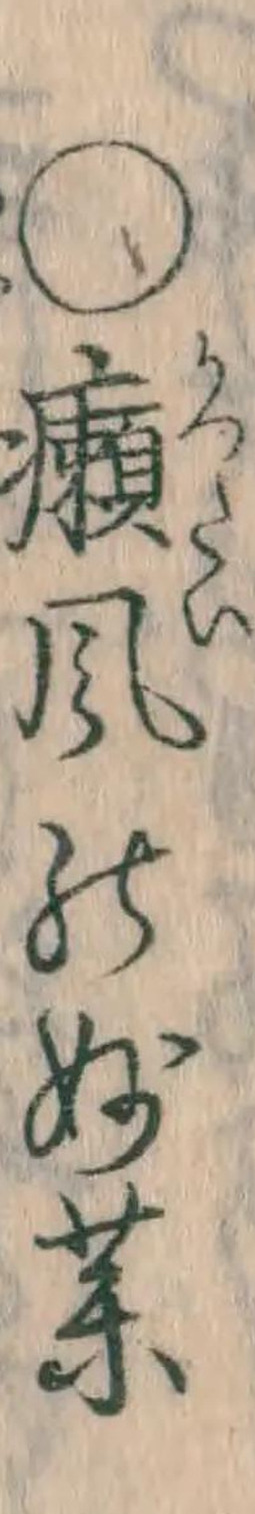○癩風の妙薬
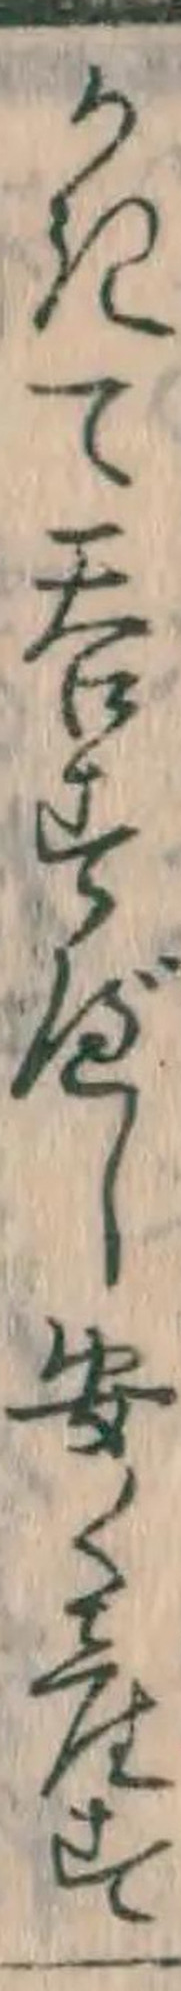かきて吞すべし安く産す
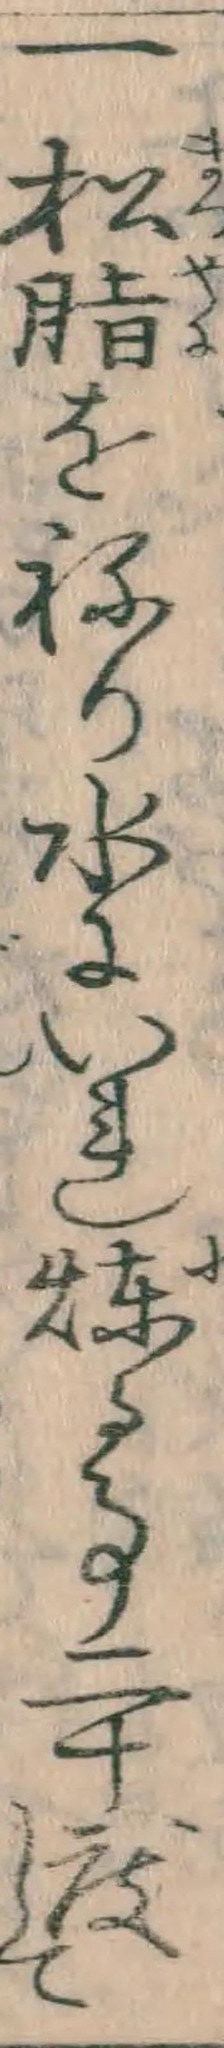一松脂をねり水に入れ煉る事二十度して
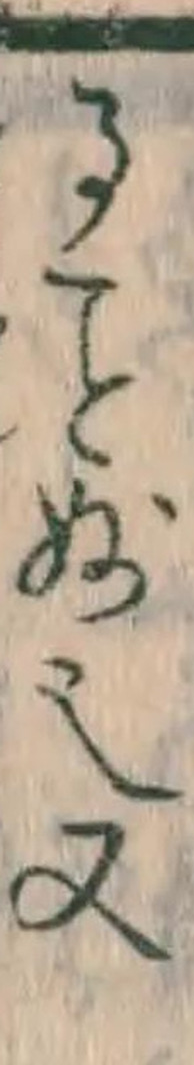ること妙也又
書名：広益秘事大全 3巻. [4]
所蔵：国立国会図書館 National Diet Library, JAPAN
